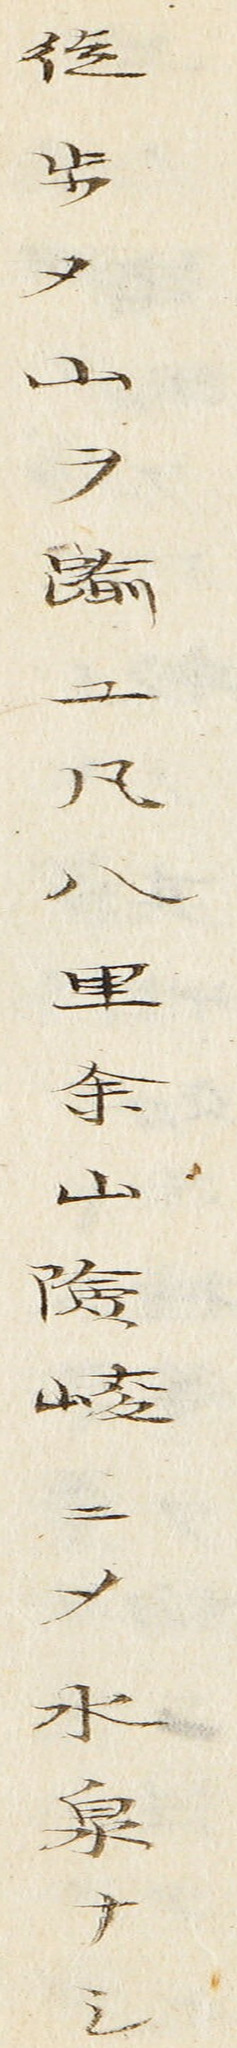徒歩シテ山ヲ踰ユ凡八里余山険峻ニシテ水泉ナシ
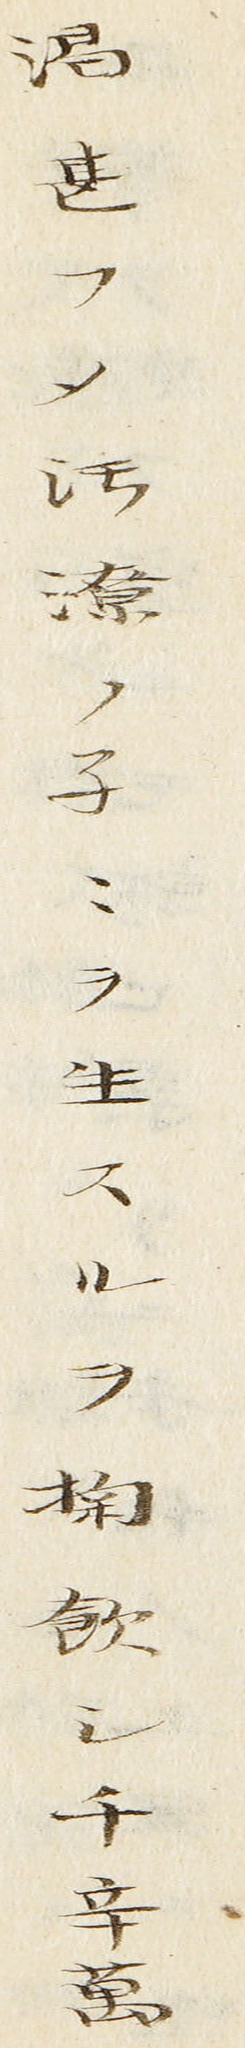渇甚フシテ汚潦ノ孑々ヲ生スルヲ掬飲シ千辛万
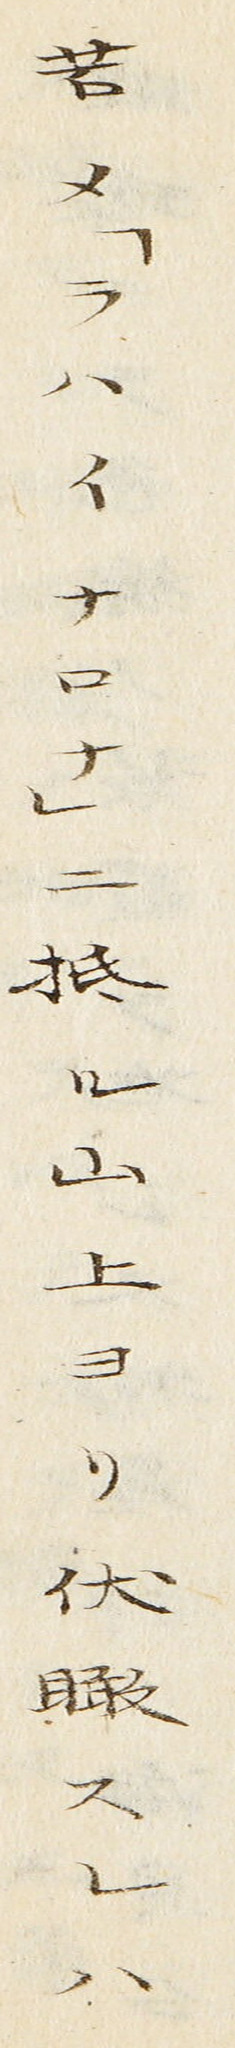苦シテ「ラハイナロナ」ニ抵ル山上ヨリ伏瞰スレハ
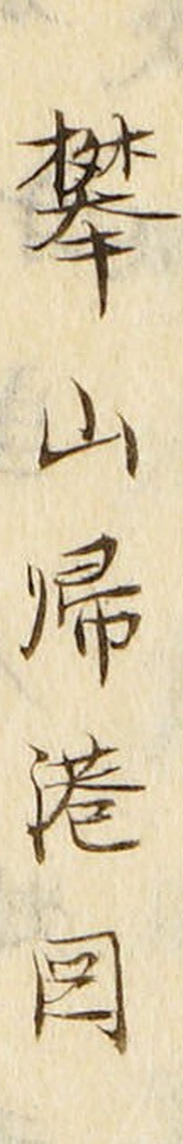攀山帰港図

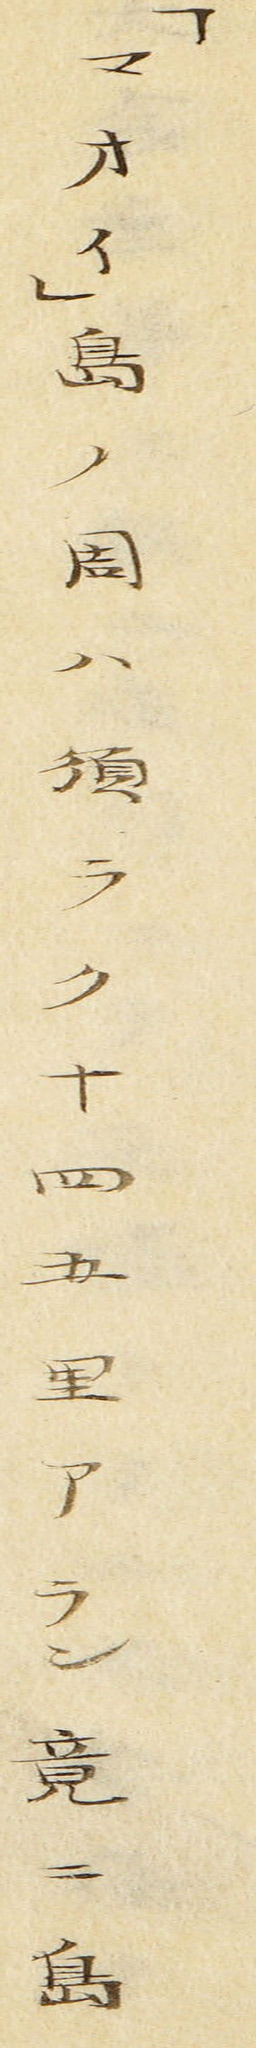「マオイ」島ノ周ハ須ラク十四五里アラン竟ニ島
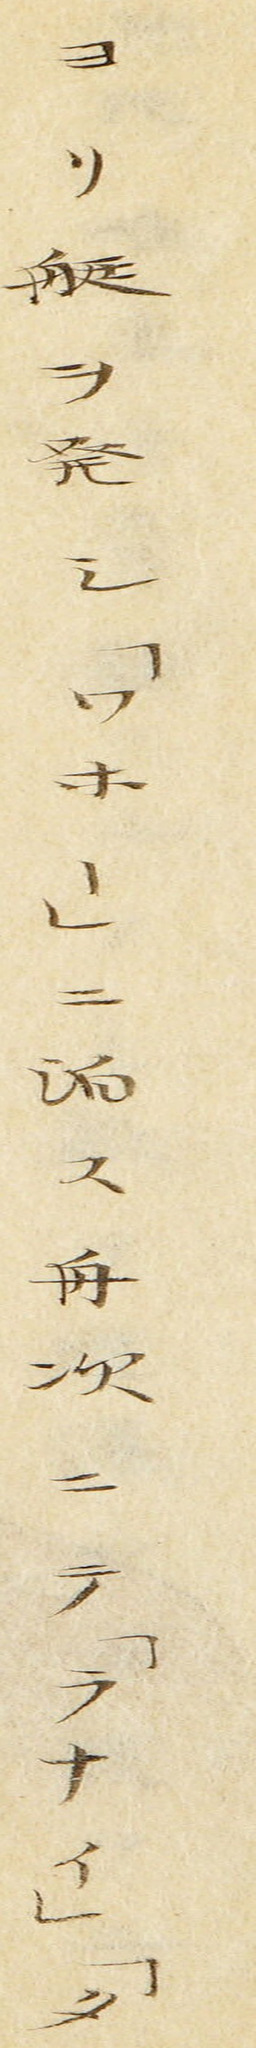ヨリ艇ヲ発シ「ワホー」ニ泊ス舟次ニテ「ラナイ」「タ
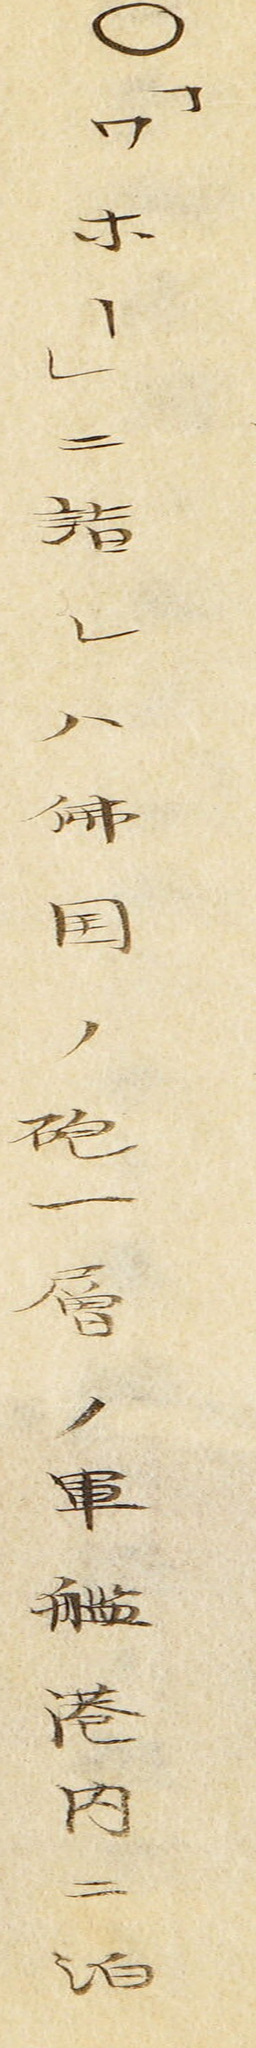○「ワホー」ニ詣レハ仏国ノ砲一層ノ軍艦港内ニ泊
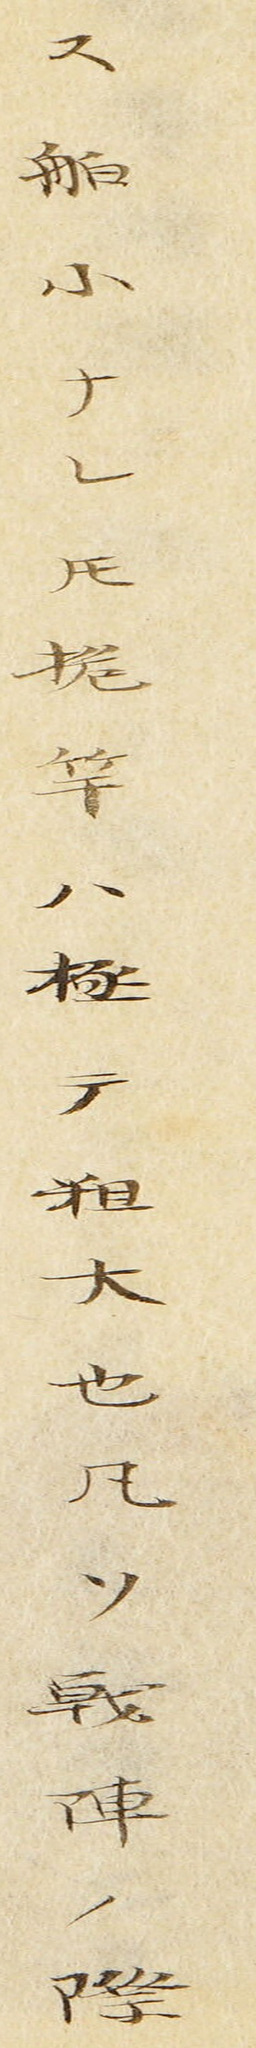ス舶小ナレトモ桅竿ハ極テ粗大也凡ソ戦陣ノ際
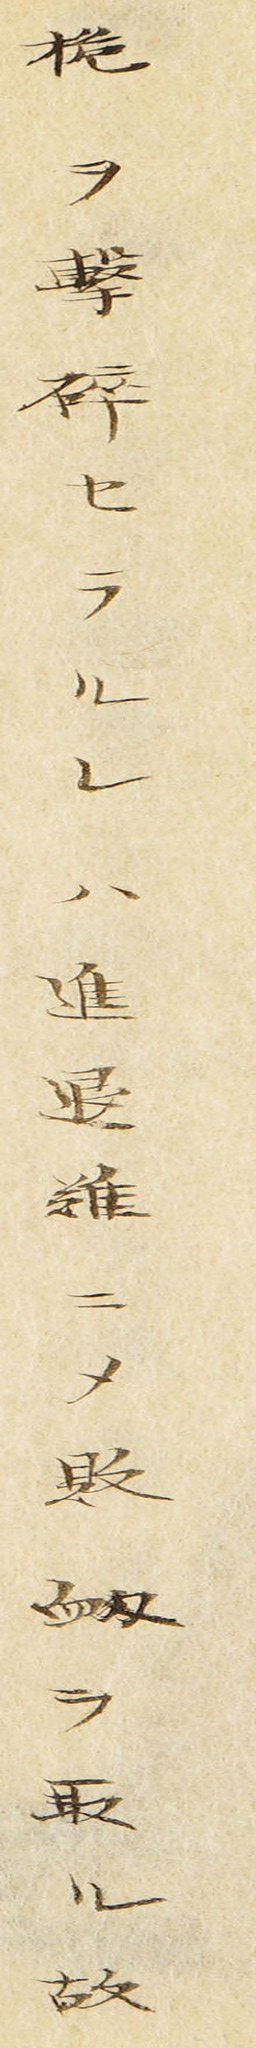桅ヲ撃碎セラルレハ進退難ニシテ敗衂ヲ取ル故
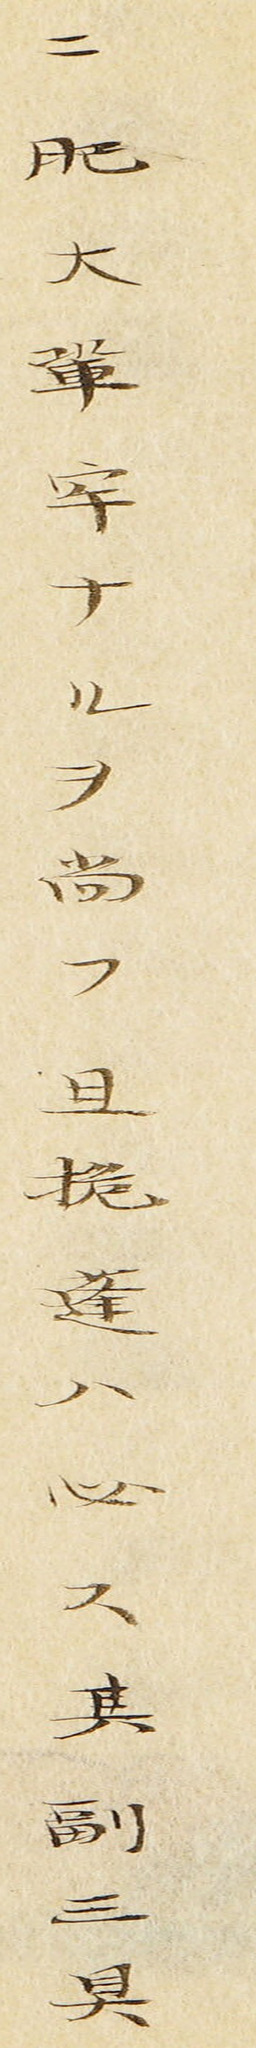ニ肥大𨋑牢ナルヲ尚フ且桅ハ必ス其副三具
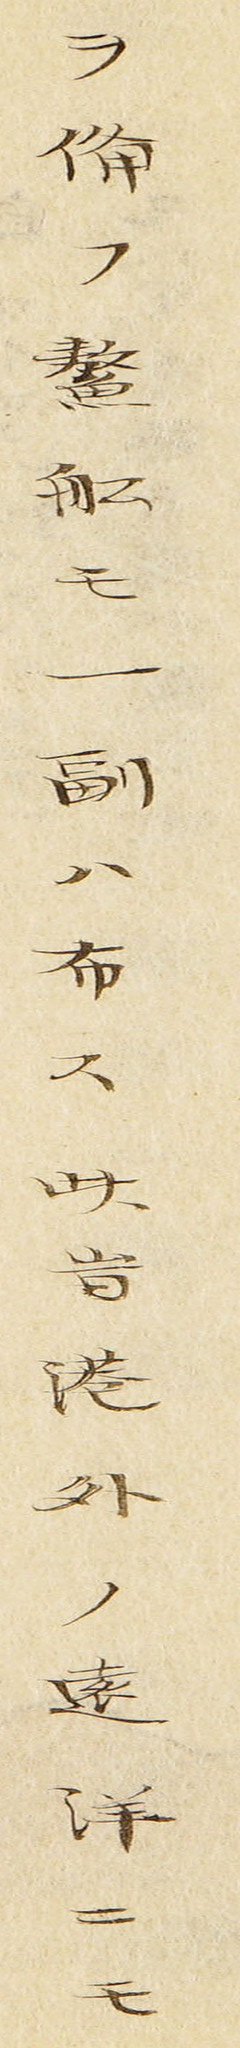ヲ備フ鰲船モ一副ハ布ス此旹港外ノ遠洋ニモ
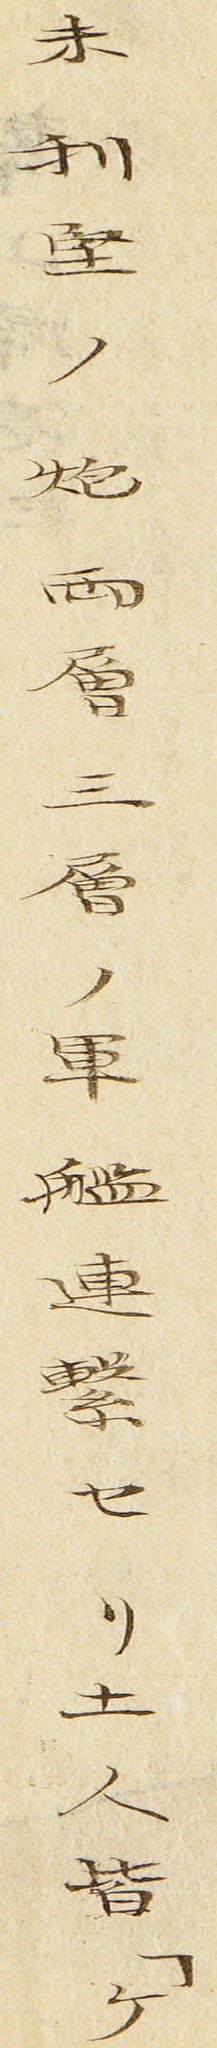未利堅ノ炮両層三層ノ軍艦連繋セリ土人皆「ケ
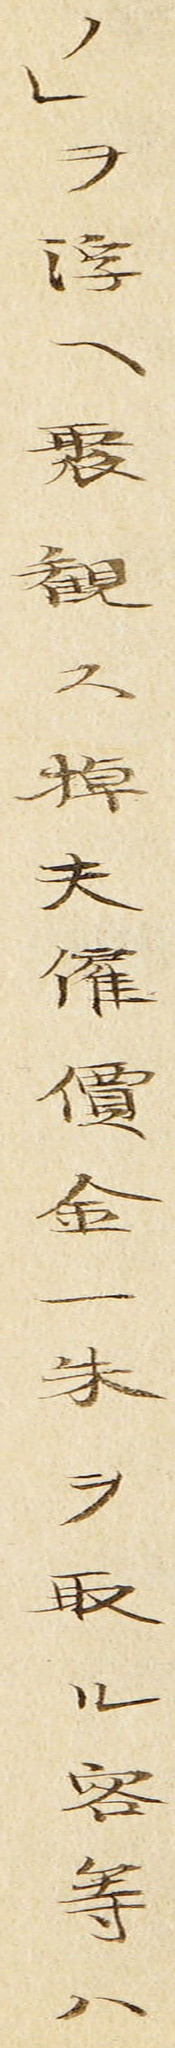ノ」ヲ浮ヘ聚観ス棹夫僱価金一朱ヲ取ル客等ハ
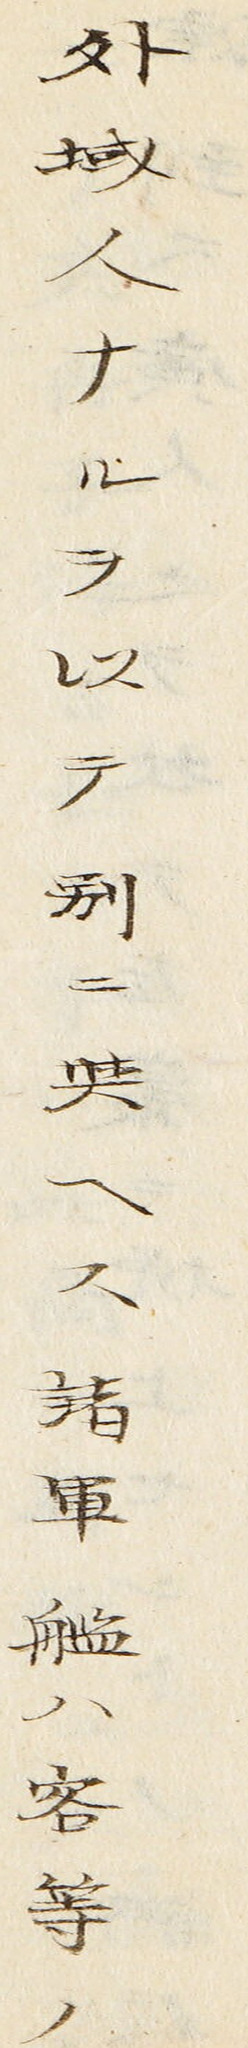外域人ナルヲ以テ別ニ与ヘス諸軍艦ハ客等ノ
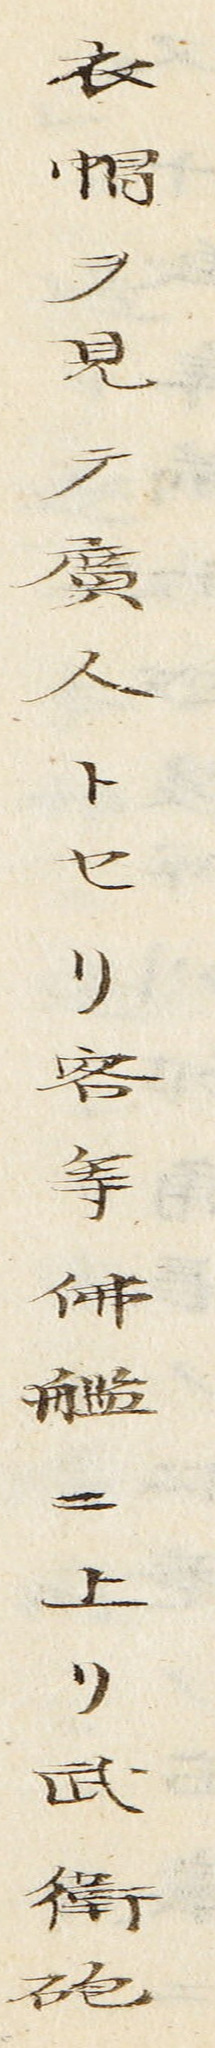衣帽ヲ見テ広人トセリ客等仏艦ニ上リ武衛砲
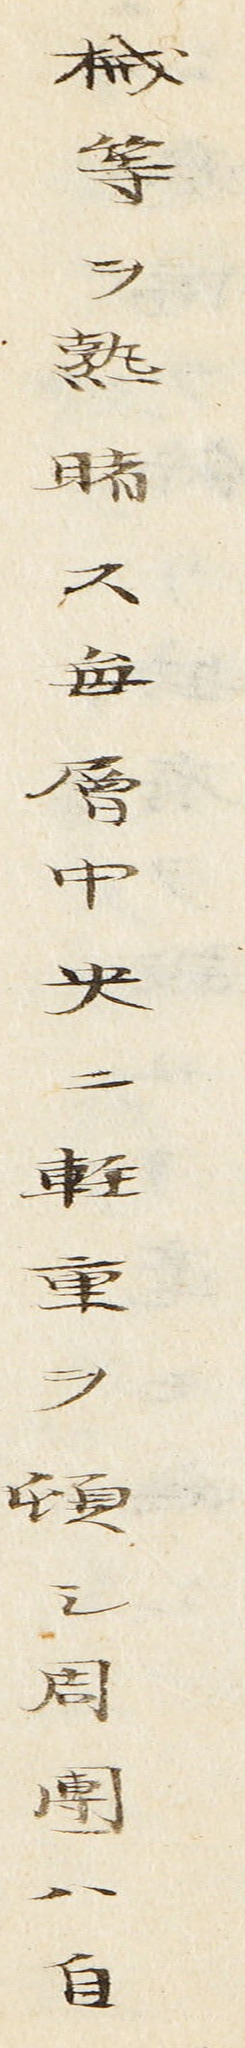械等ヲ熟睹ス毎層中央ニ軽重ヲ頓シ周団ハ自
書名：流蕃通書
